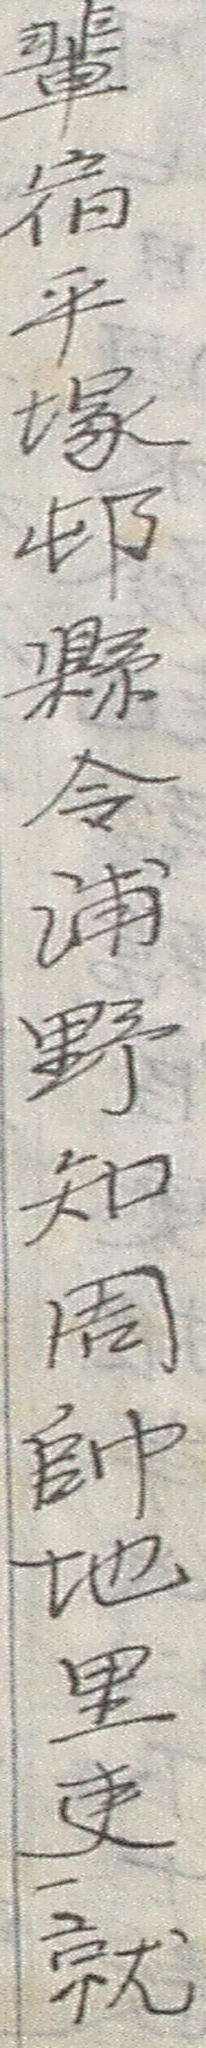輩宿平塚邨縣令浦野知周師地里吏就
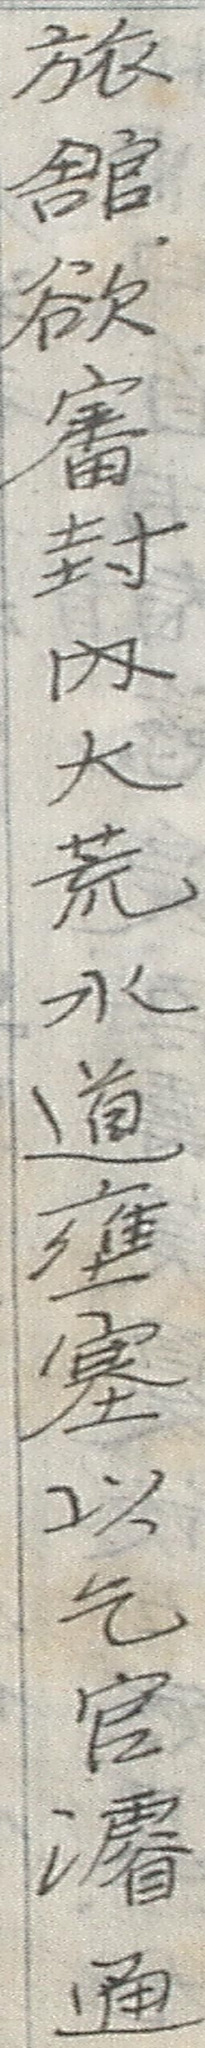旅舘、欲審封内大荒水道壅塞以乞官濬通
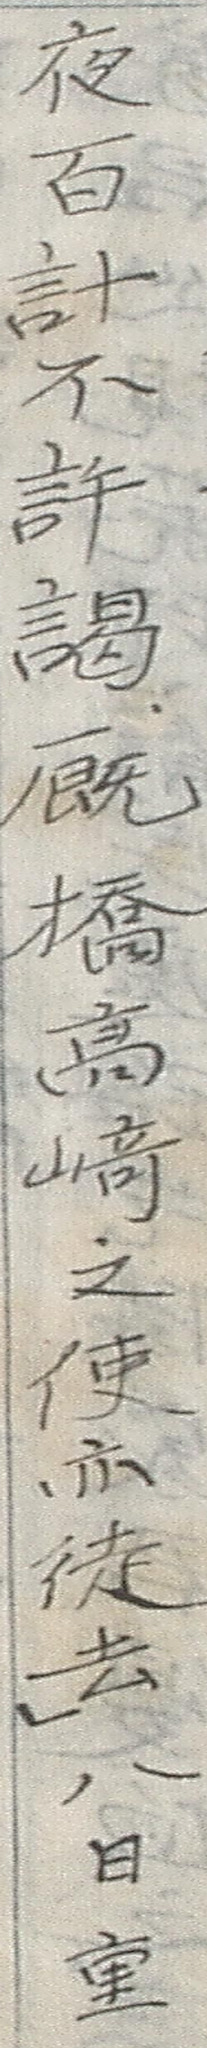夜百計不許謁厩橋高崎之使亦徒去ㇾ八日重
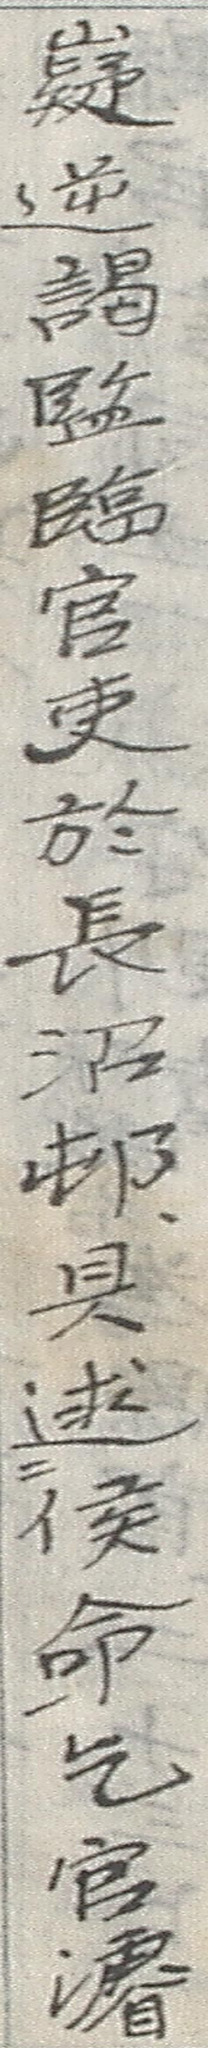嶷逆謁監臨官吏於長沼邨、具述侯命乞官濬
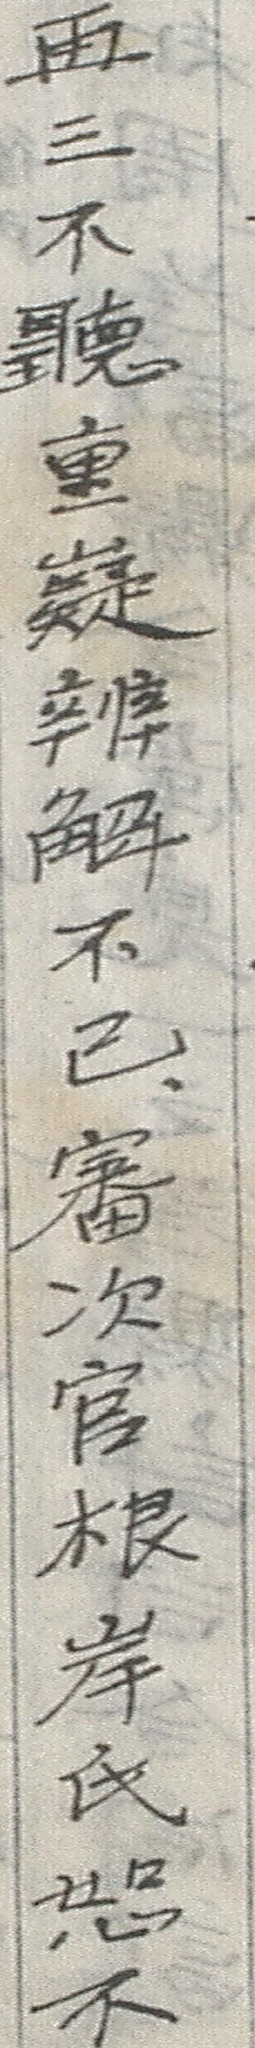再三不聴重嶷辨解不己、審次官根岸氏恕不
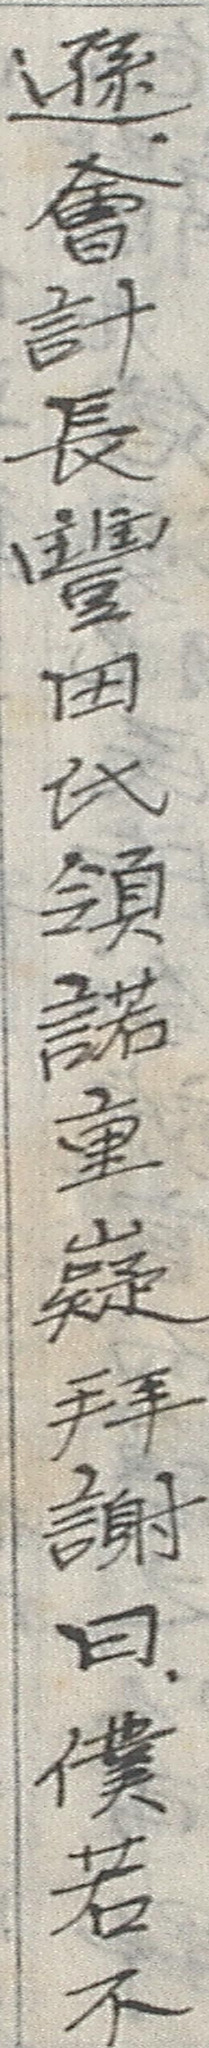遜、会計長豊田氏領諾重嶷拝謝曰、僕若不
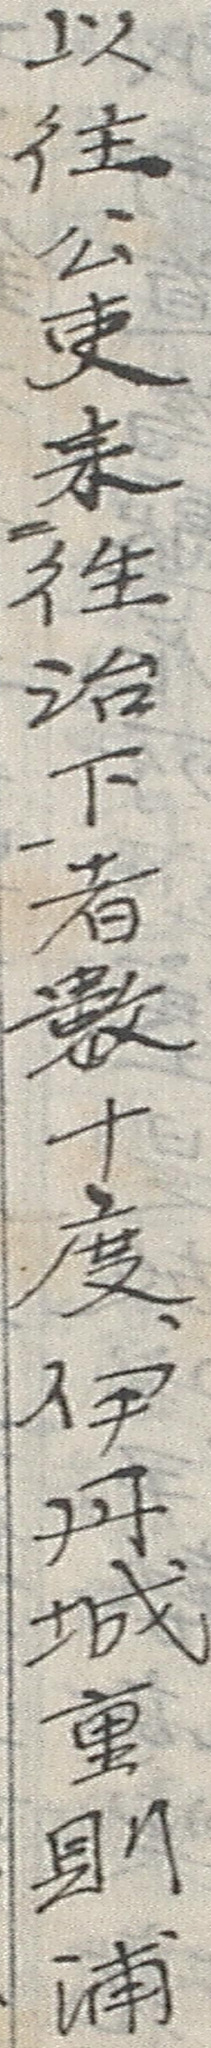以往公吏来往治下者数十度、伊丹城重則浦
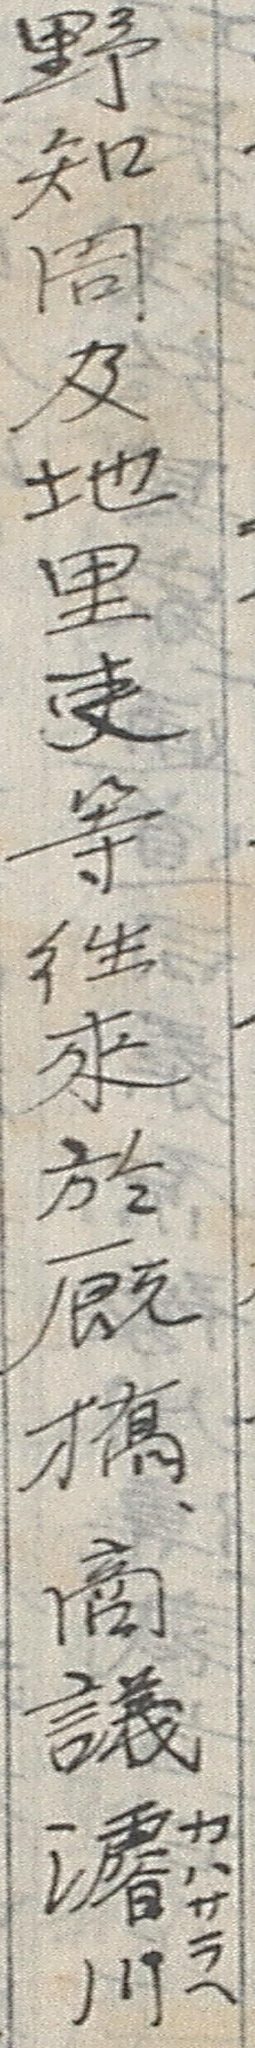野知周及地理史等往来於厩橋、商議濬川
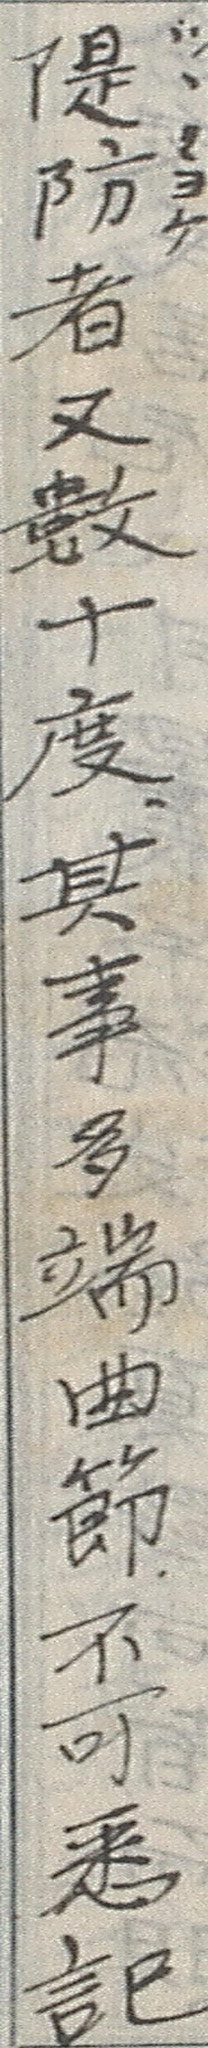隄防者又数十度、其殊多端曲折、不可悉記
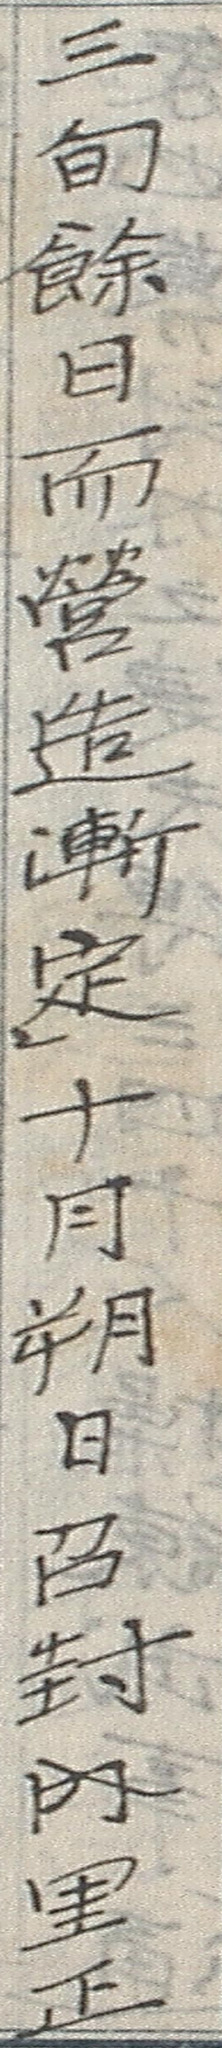三旬餘日而営造漸定ㇾ十月朔日召封内里正
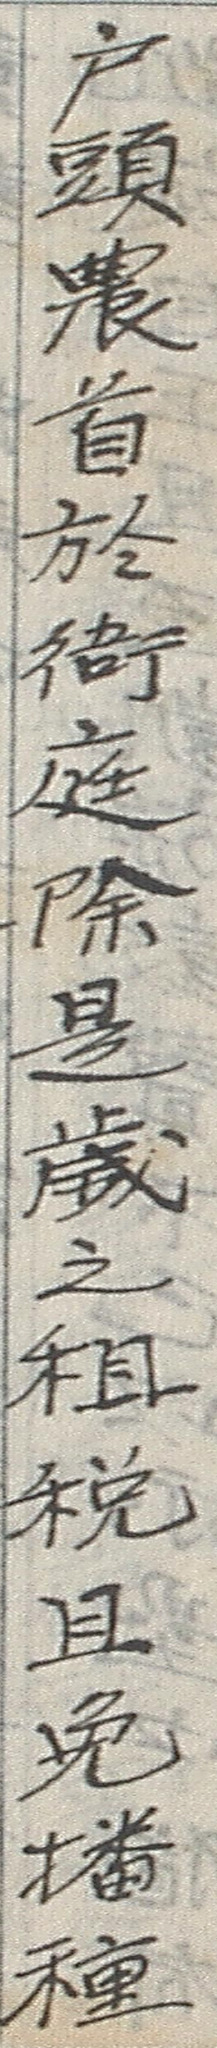戸頭農首於衛庭除是歳之租税且免播種
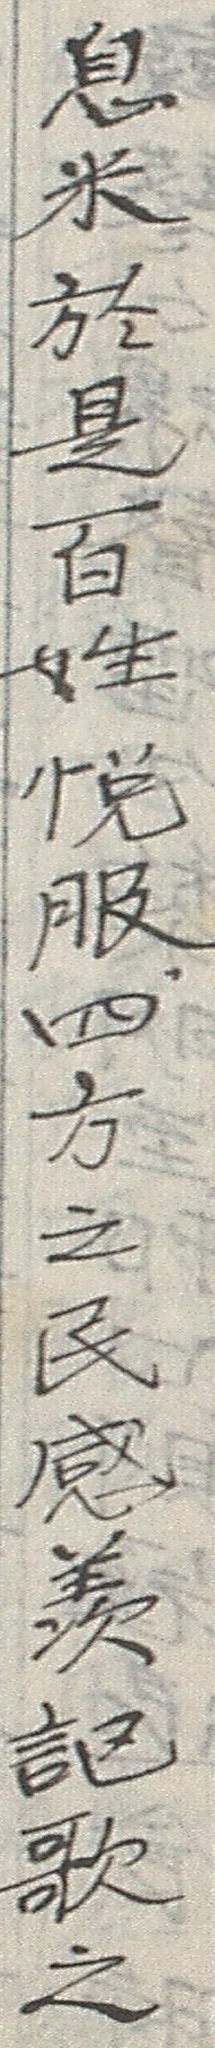息米於是百性悦服、四方之民感羨記歌之
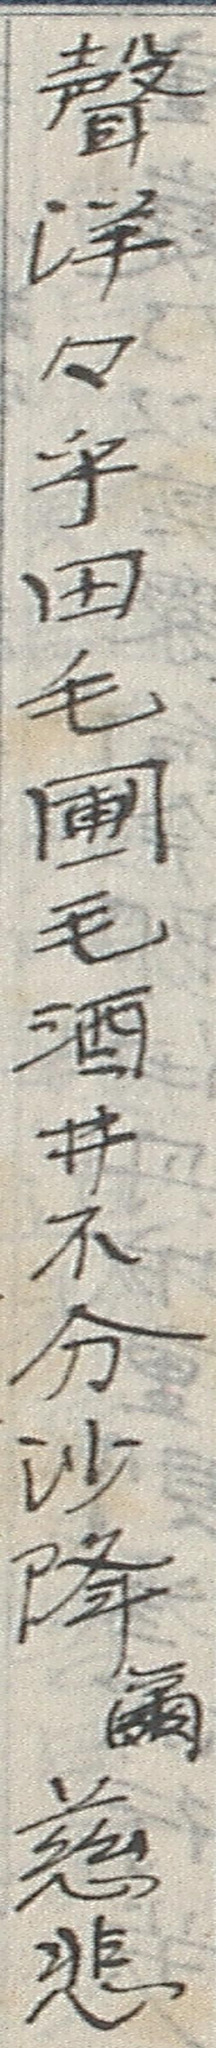声洋々乎田毛圃毛酒井不分沙降爾慈悲
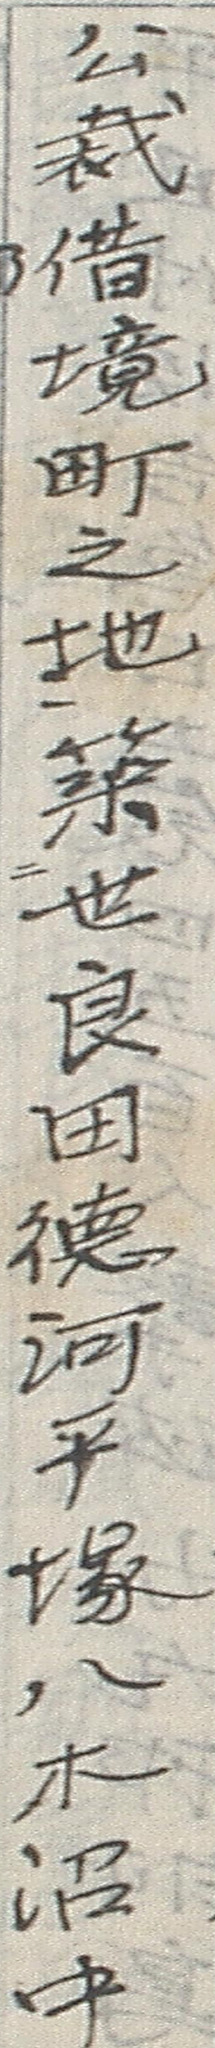公栽借境町之地築世良田徳河平塚八木沼中
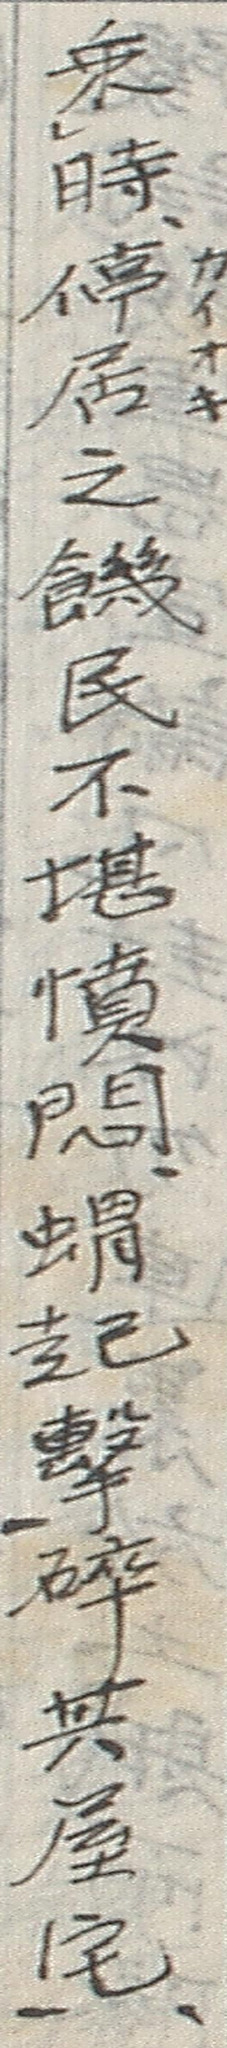乗ㇾ時停居之饑民不堪憤悶蝟起撃砕其屋宅カエリ、
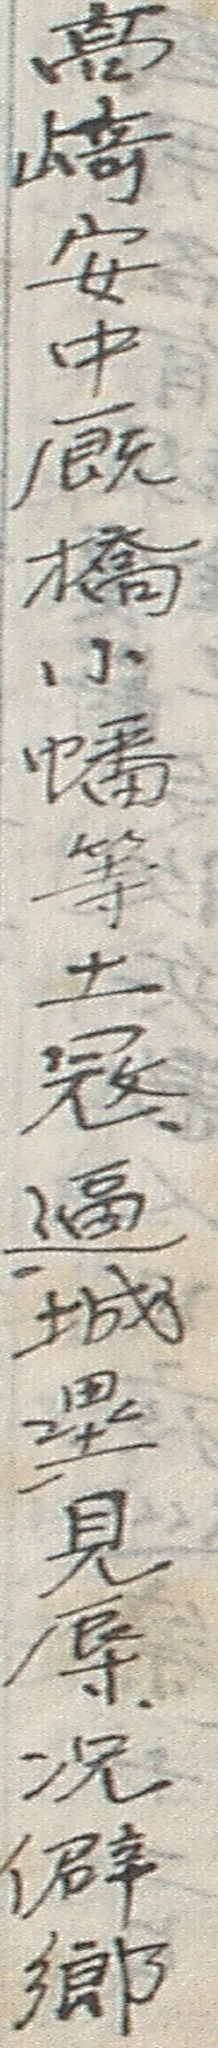高崎安中厩橋小幡等土冦、逼城塁見辱况僻郷
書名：天明三年癸卯六月　沙降記　［蕗原拾続巻之五十二］
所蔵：東京大学地震研究所図書室 Earthquake Research Institute Library, The University of Tokyo, JAPAN
